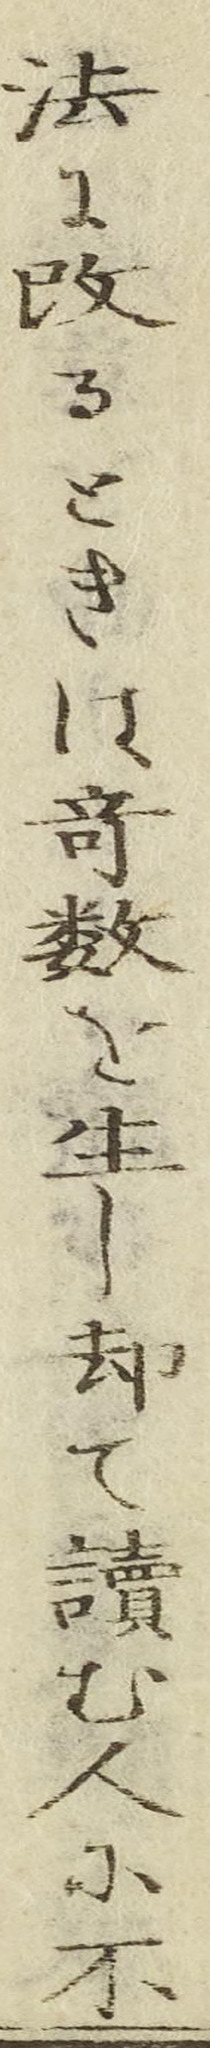法に改るときは奇数を生し却て読む人に不
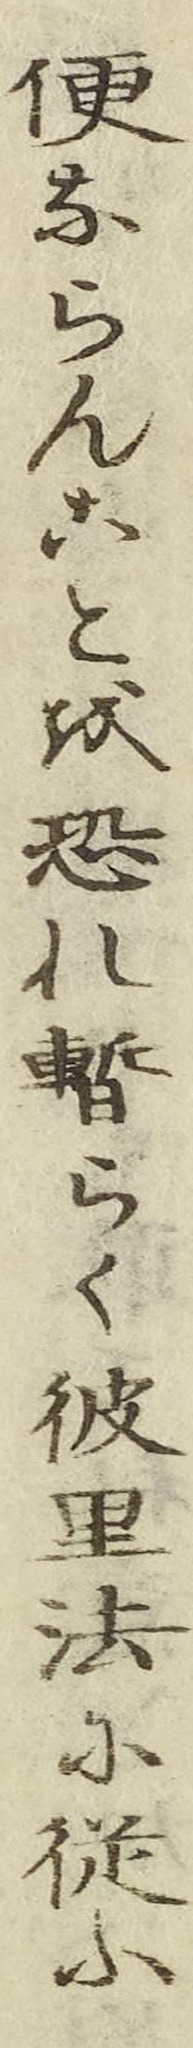便ならんことを恐れ暫らく彼里法に従ふ
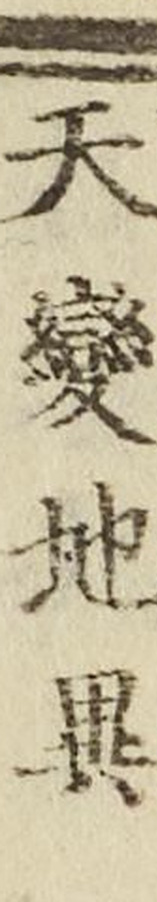天変地異
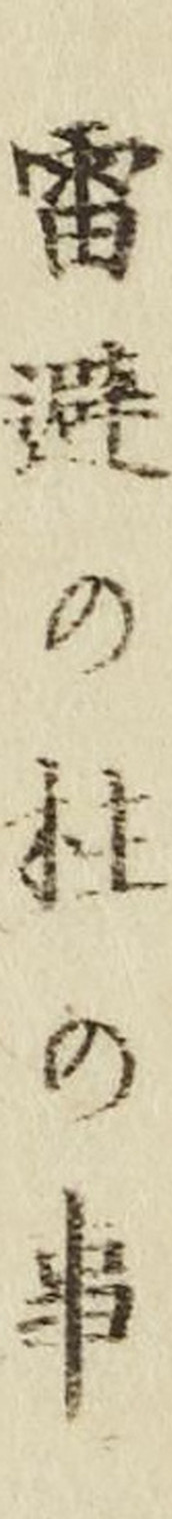雷避の柱の事
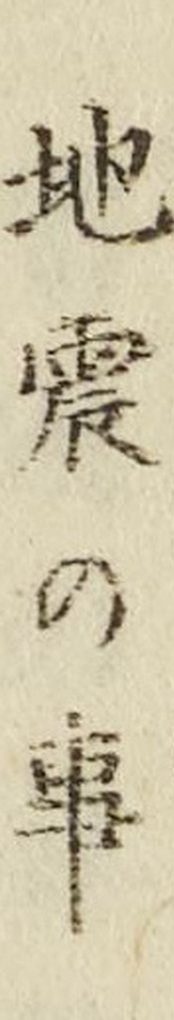地震の事
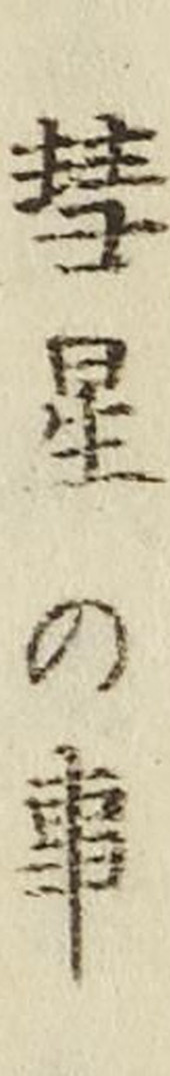彗星の事
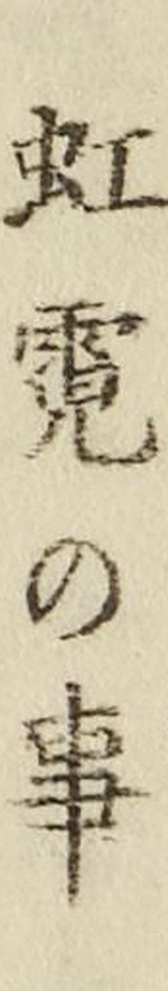虹霓の事
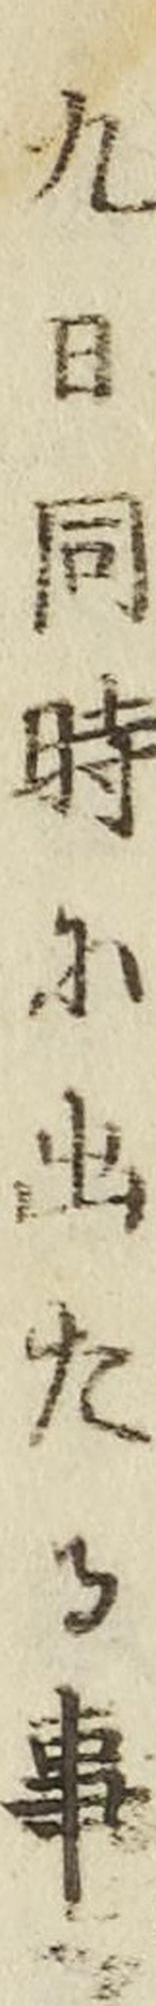九日同時に出たる事
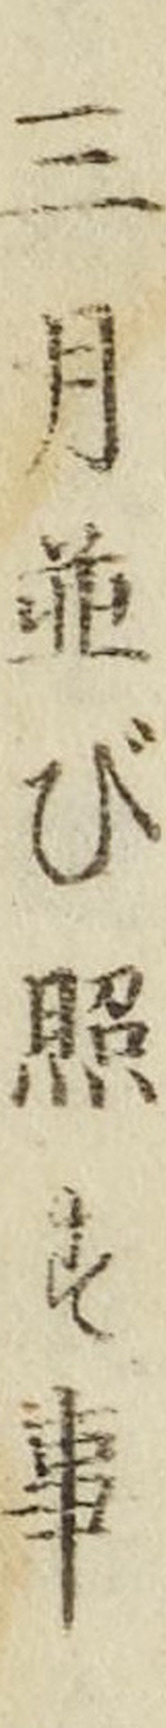三月並び照す事
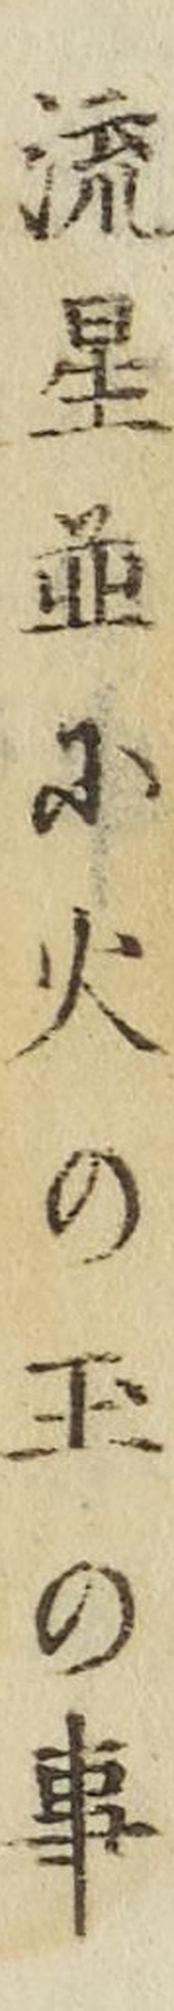流星並に火の玉の事

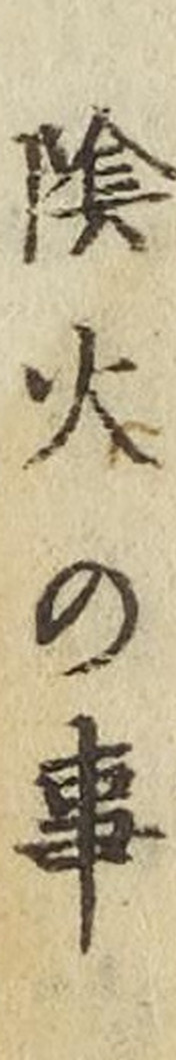陰火の事
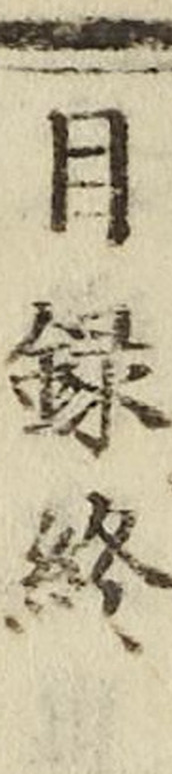目録終
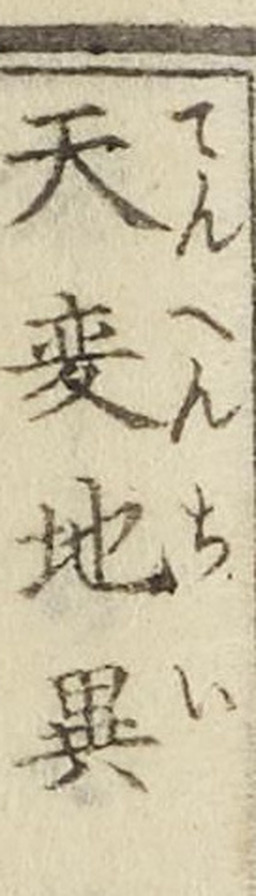天変地異
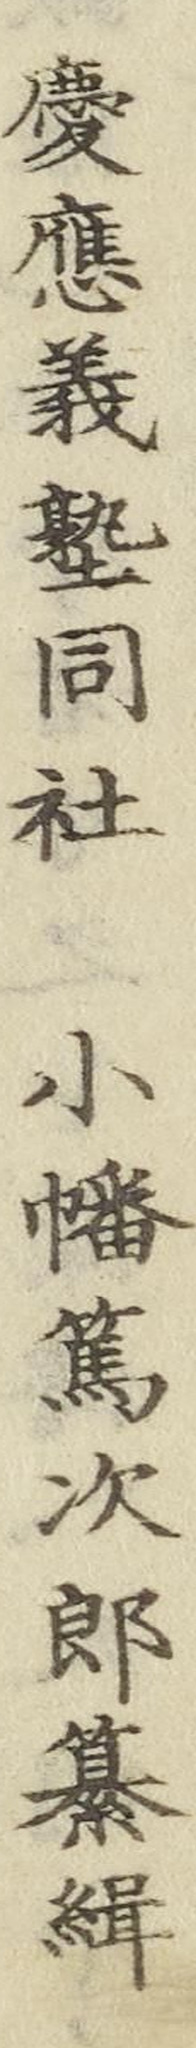慶應義塾同社小幡篤次郎纂緝
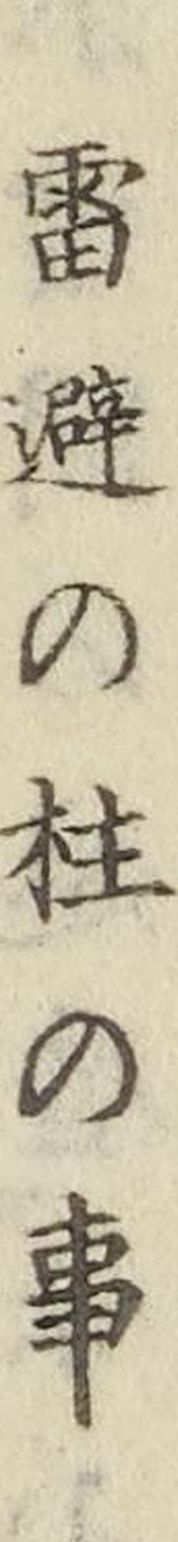雷避の柱の事
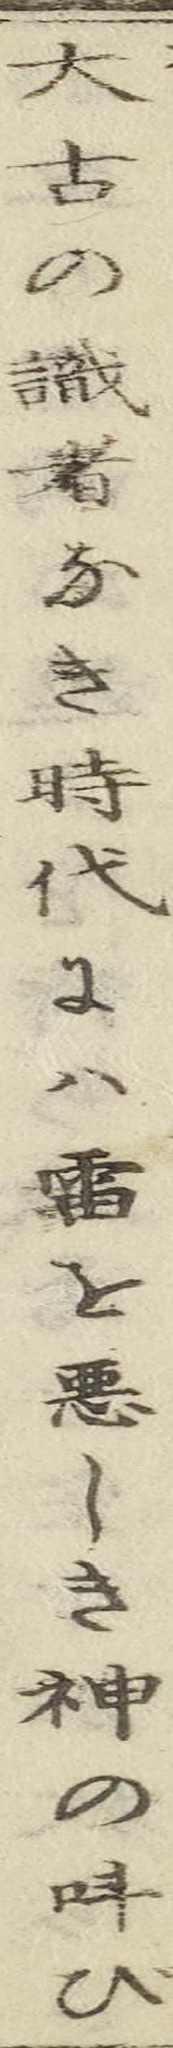大古の識者なき時代には雷を悪しき神の叫び
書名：天変地異
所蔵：東京大学地震研究所図書室 Earthquake Research Institute Library, The University of Tokyo, JAPAN
